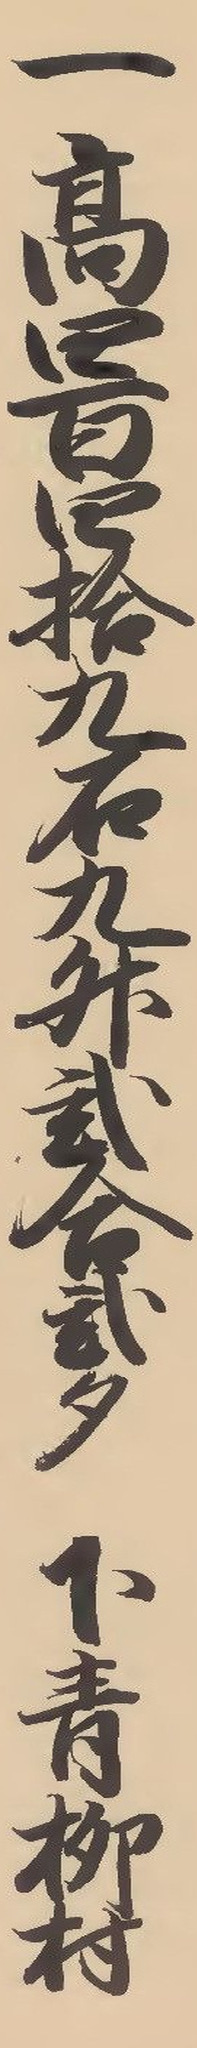一高四百四拾九石九升弐合弐勺下青柳村
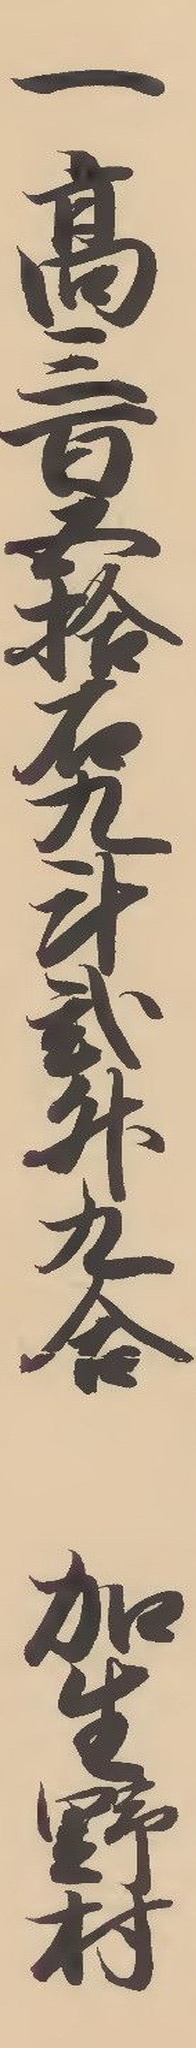一高三百五拾石九斗弐升九合加生野村

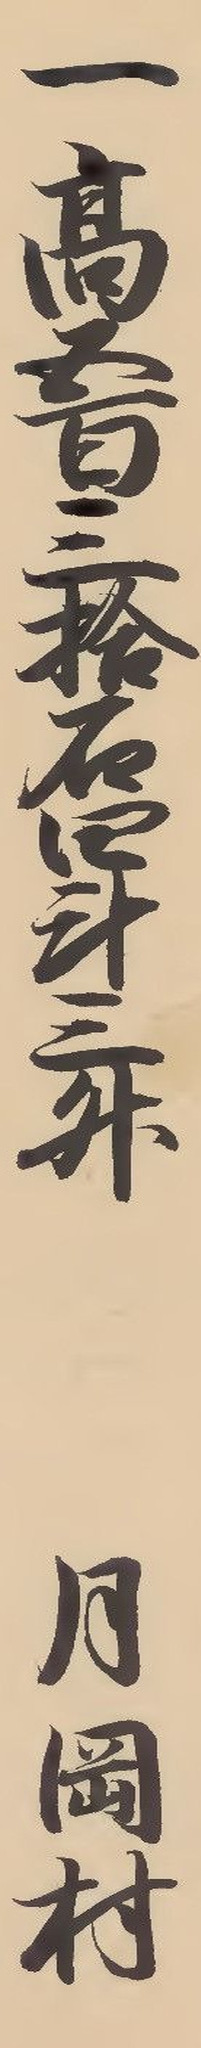一高五百三拾石四斗三升月岡村
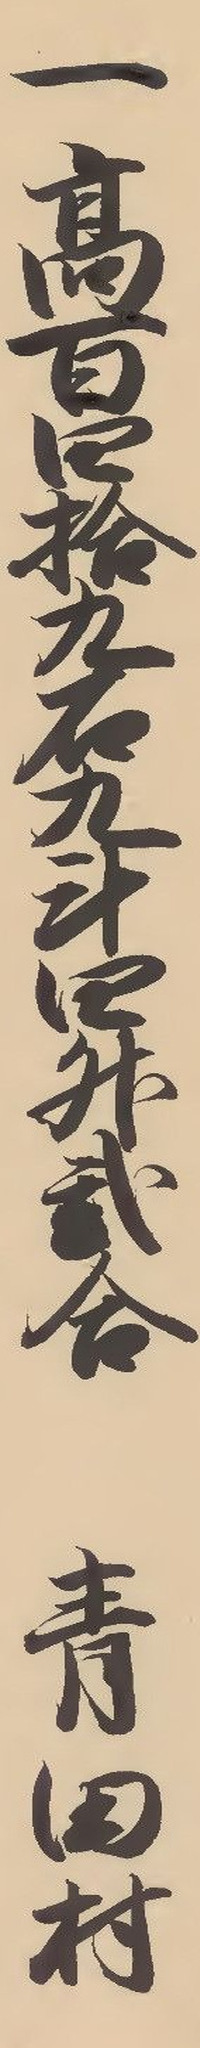一高百四拾九石九斗四升弐合青田村
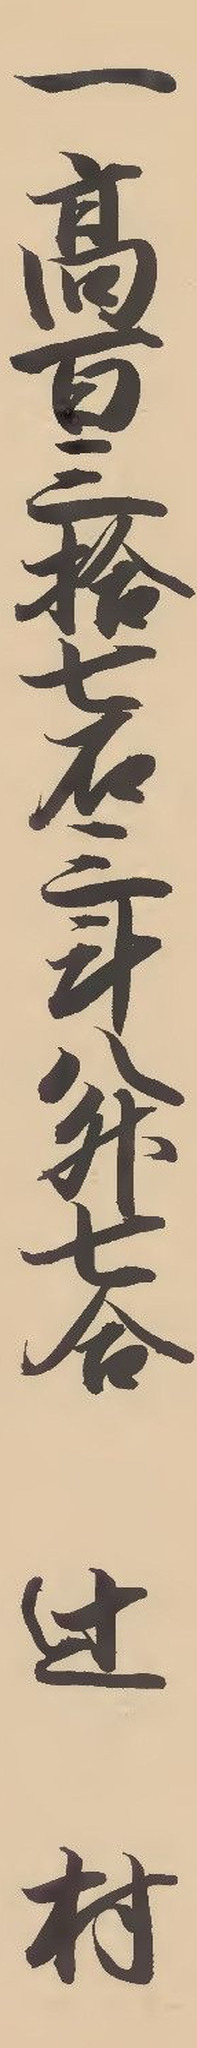一高百三拾七石三斗八升七合辻村
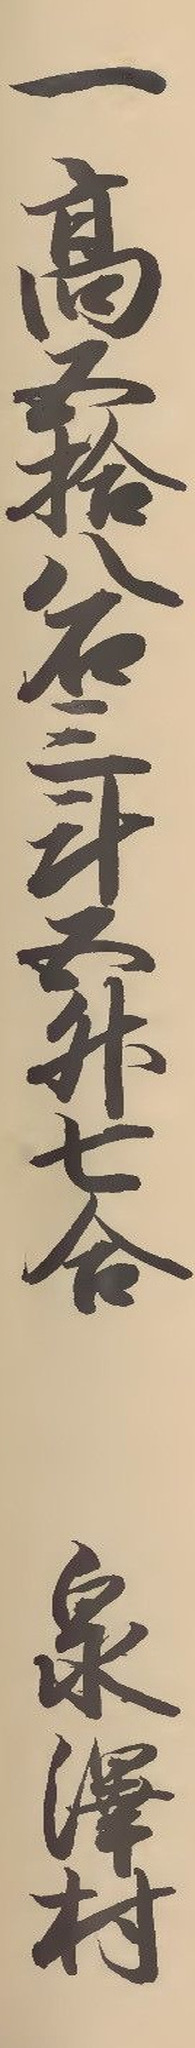一高五拾八石三斗五升七合泉沢村
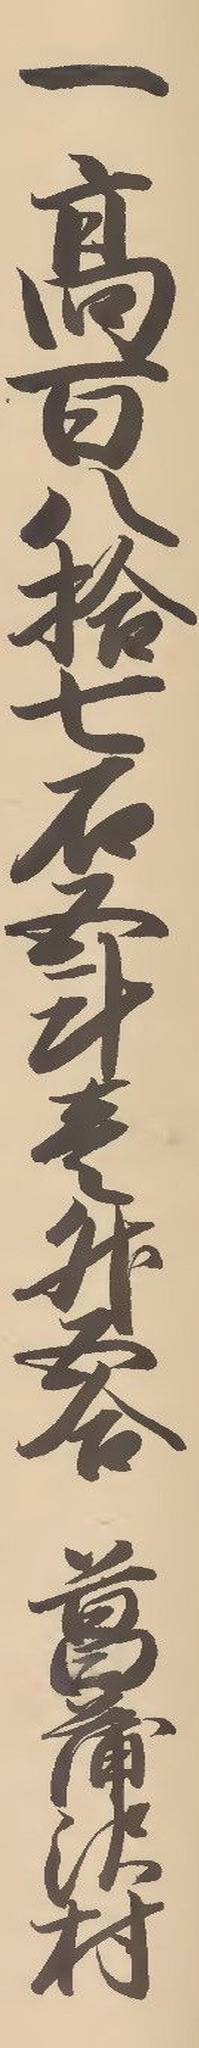一高百八拾七石五斗壱升五合菖蒲沢村
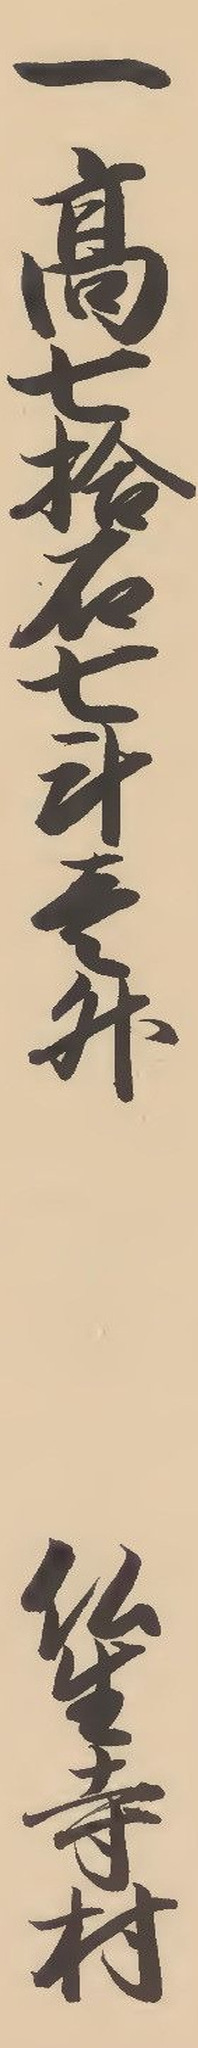一高七拾石七斗壱升仏生寺村
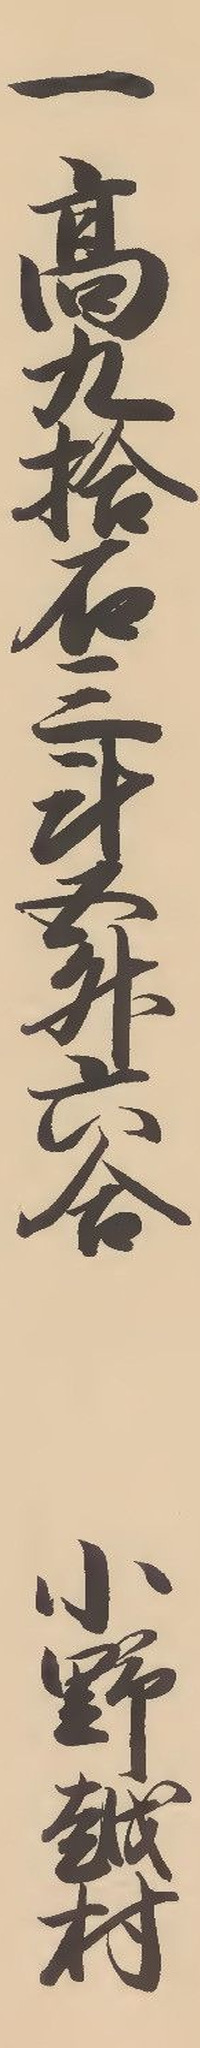一高九拾石三斗五升六合小野越村
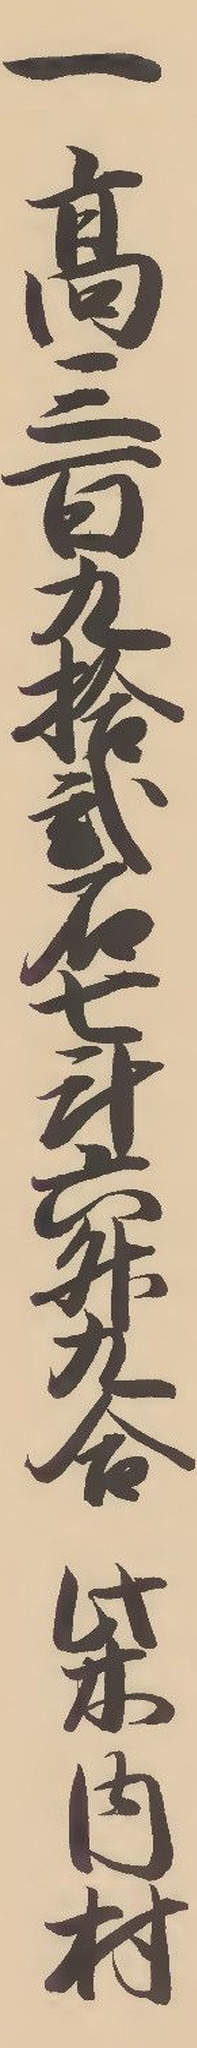一高三百九拾弐石七斗六升九合柴内村

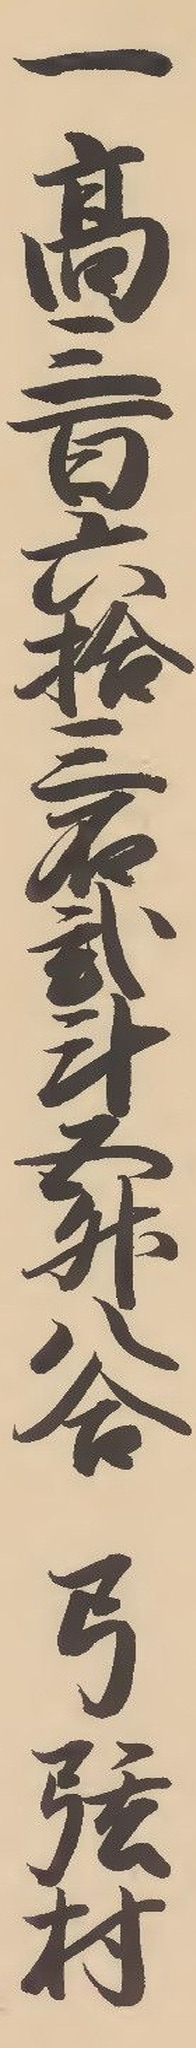一高三百六拾三石弐斗五升八合弓弦村
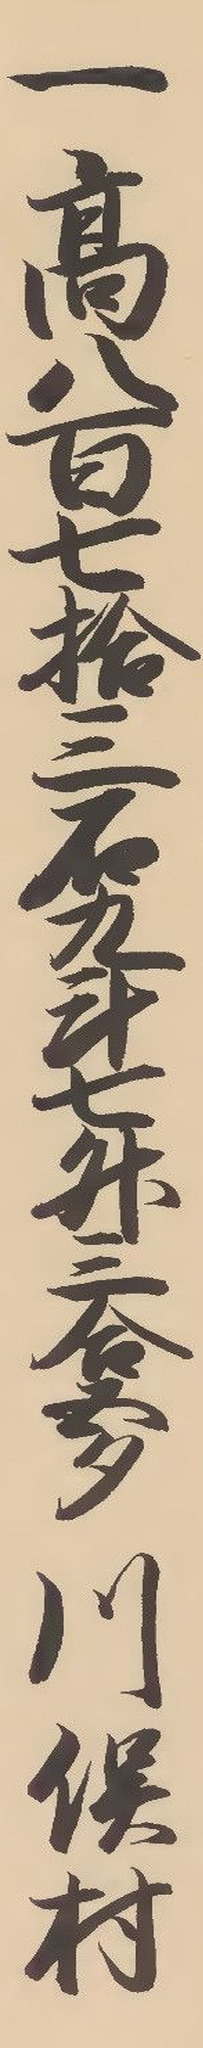一高八百七拾三石九斗七升三合五勺川俣村
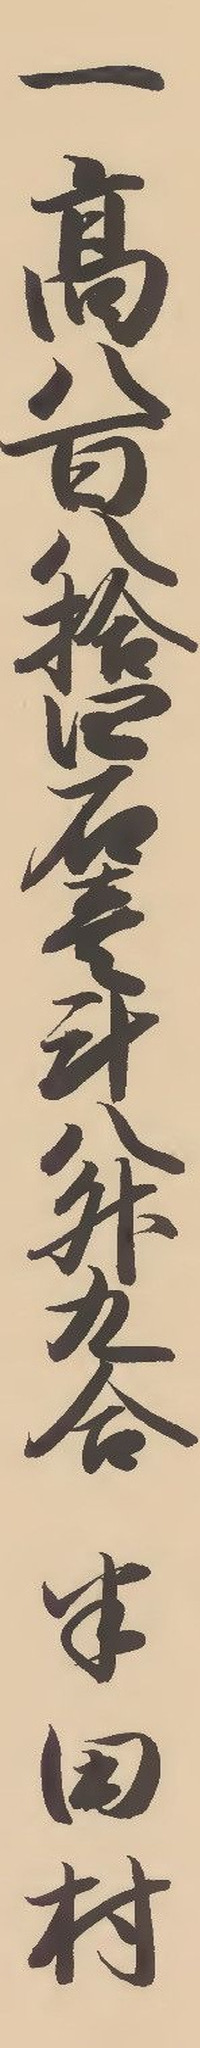一高八百八拾四石壱斗八升九合半田村
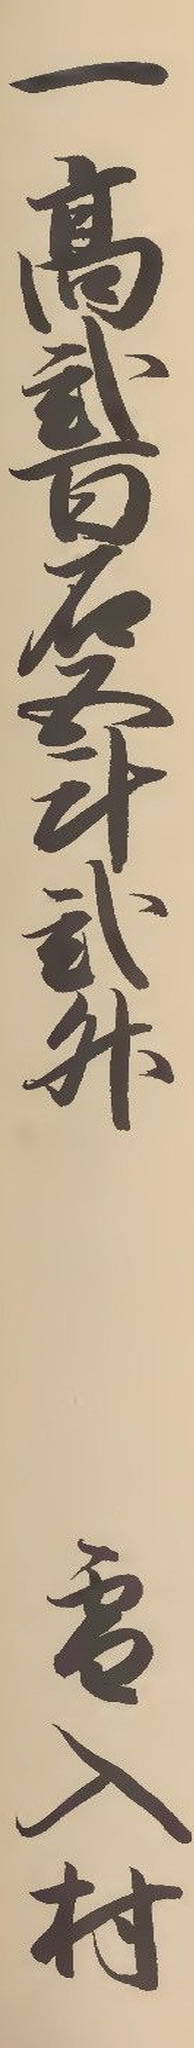一高弐百石五斗弐升雪入村
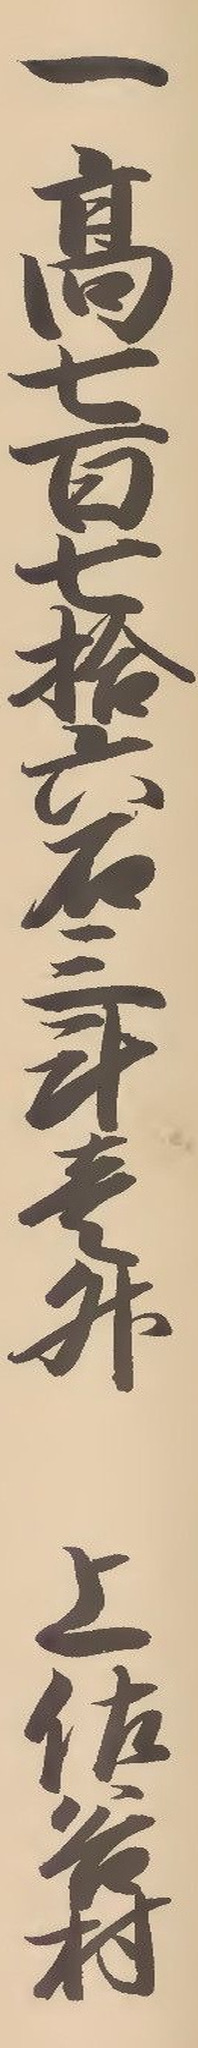一高七百七拾六石三斗壱升上佐谷村
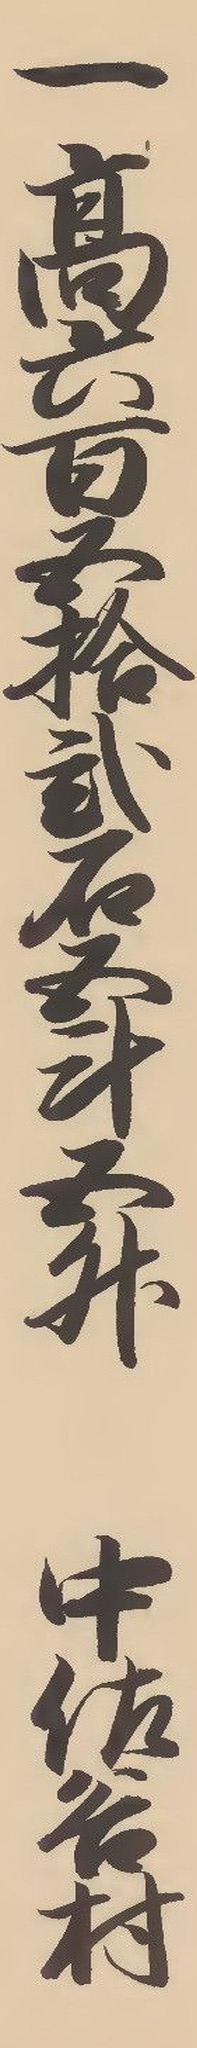一高六百五拾弐石五斗五升中佐谷村
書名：常陸国郷帳
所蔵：国立公文書館 National Archives of Japan
